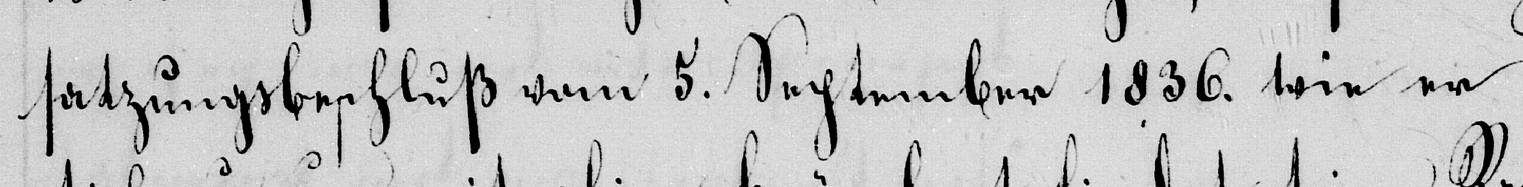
satzungsbeschluß vom 5. September 1836. wie er
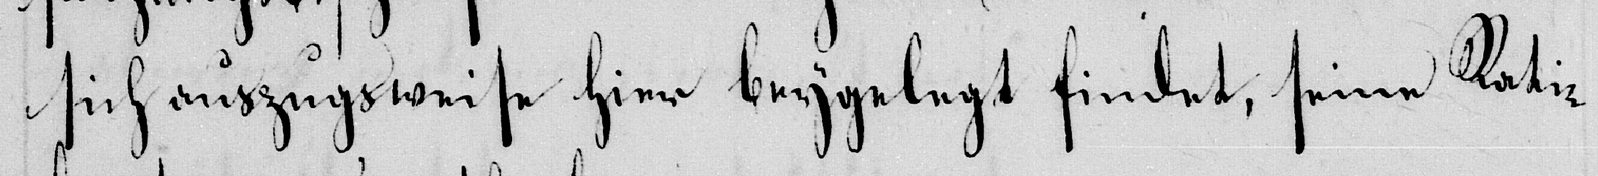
sich auszugsweise hier beygelegt findet, seine Rati¬
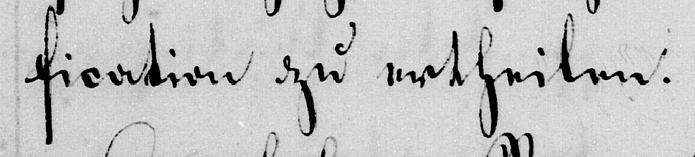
fication zu ertheilen.
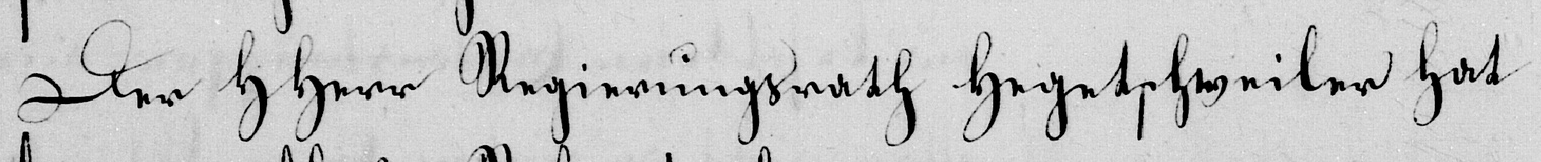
Der HHerr Regierungsrath Hegetschweiler hat
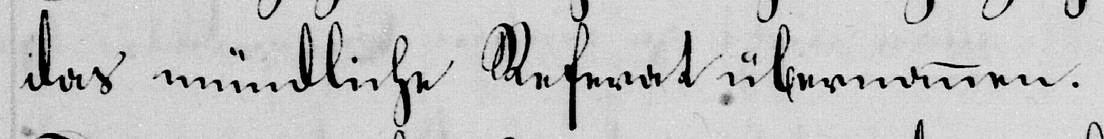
das mündliche Referat übernommen.
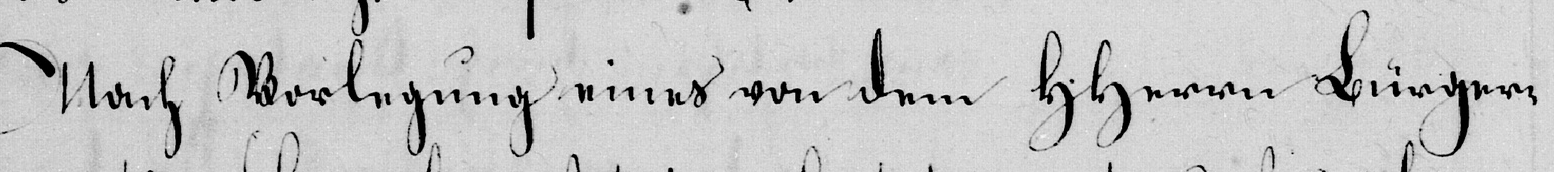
Nach Vorlegung eines von dem HHerrn Bürger¬
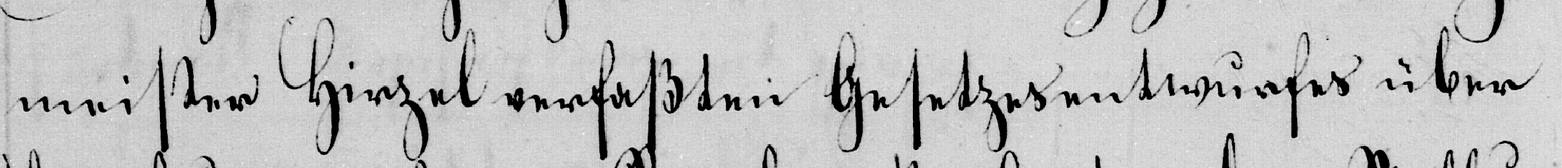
meister Hirzel verfaßten Gesetzesentwurfes über
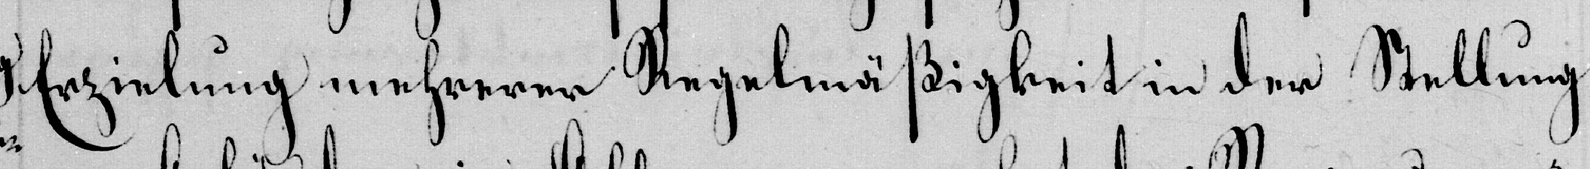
Erzielung mehrerer Regelmäßigkeit in der Stellung
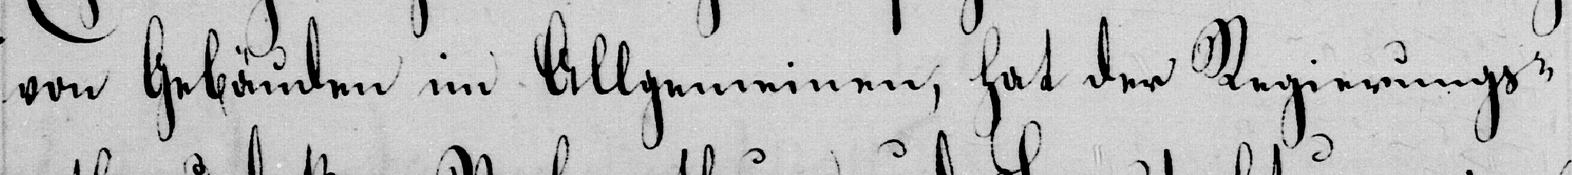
von Gebäuden im Allgemeinen, hat der Regierungs¬
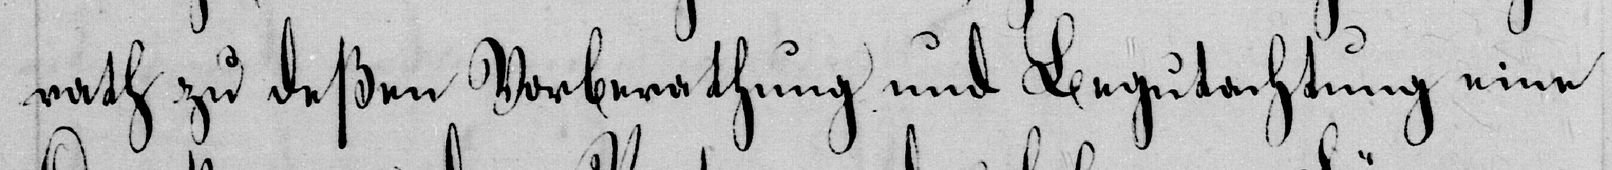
rath zu deßen Vorberathung und Begutachtung eine
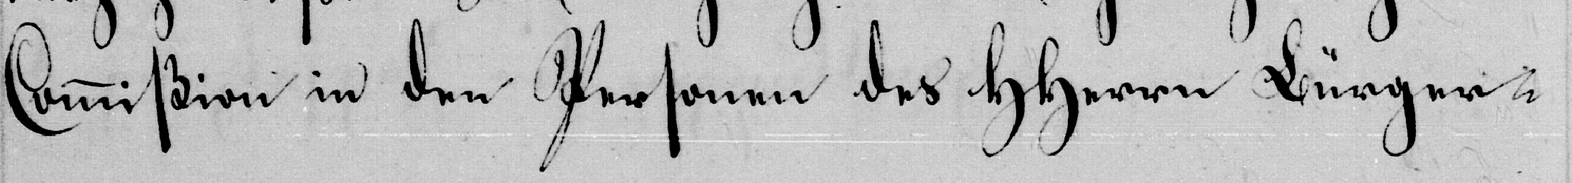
Commißion in den Personen des HHerrn Bürger-
